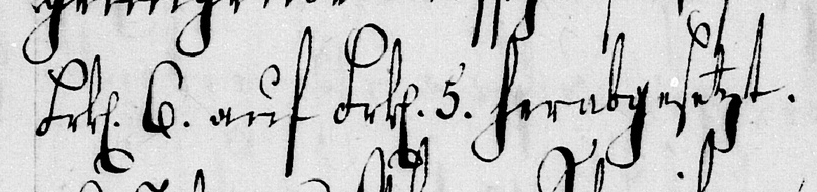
auf 3. Frk[en]. herabgesetzt,
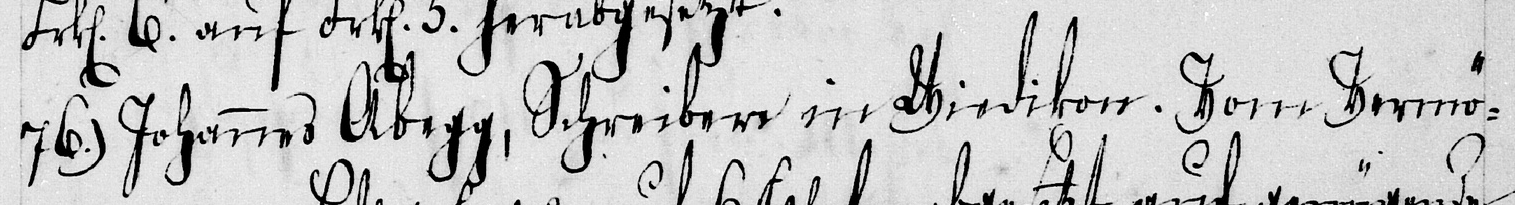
76.) Johannes Abegg, Schreiber in Wiedikon. Vom Vermö¬
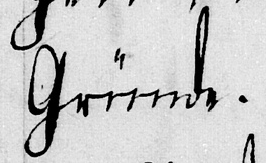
Gründe.
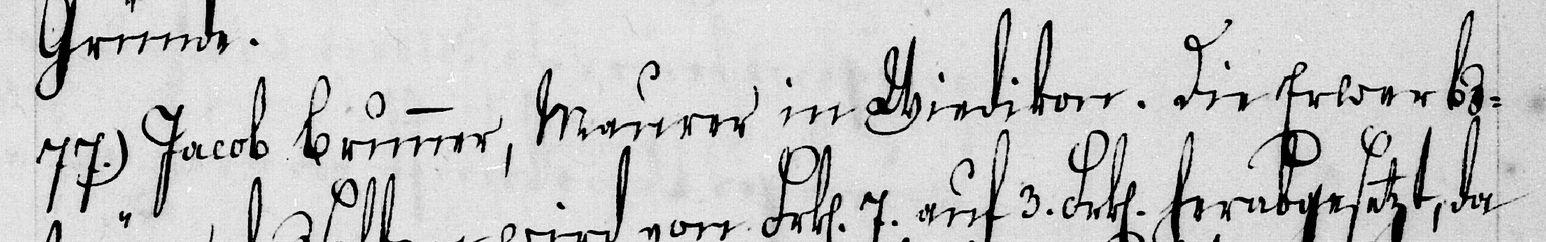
77.) Jacob Brunner, Maurer in Wiedikon. Die Erwerbss¬
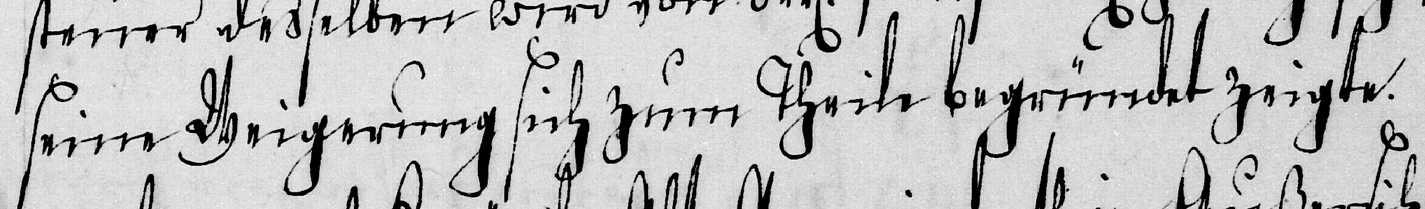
seine Weigerung sich zum Theile begründet zeigte.
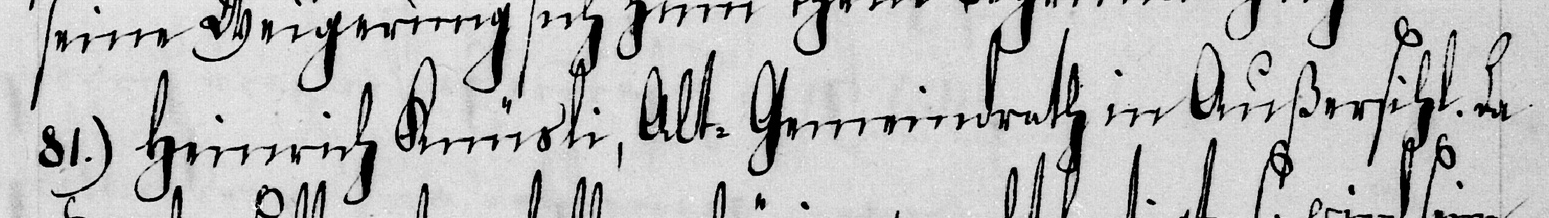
81.) Heinrich Knüsli, Alt-Gemeindrath in Außersihl. da
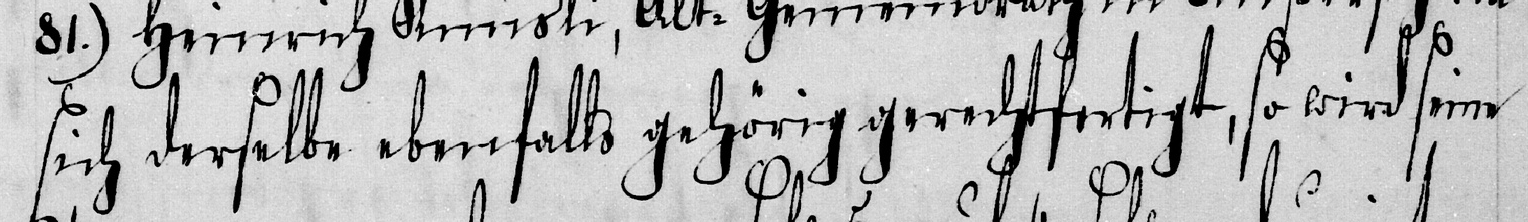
ich derselbe ebenfalls gehörig gerechtfertigt, so wird
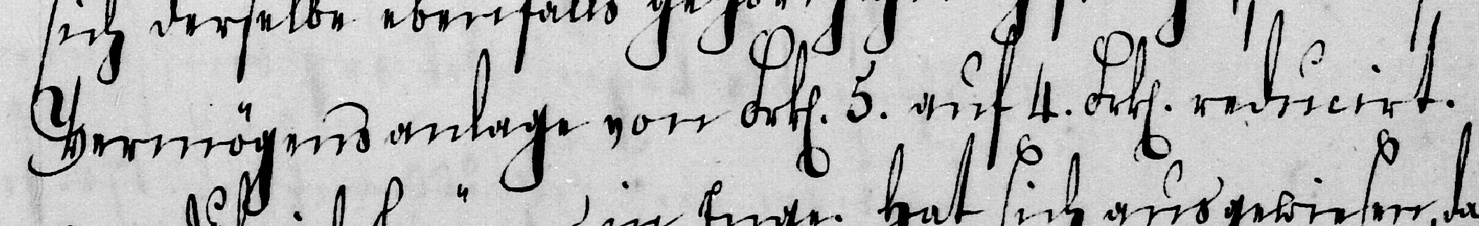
Vermögensanlage von Frk[en]. 5. auf 4. Frk[en]. reducirt.
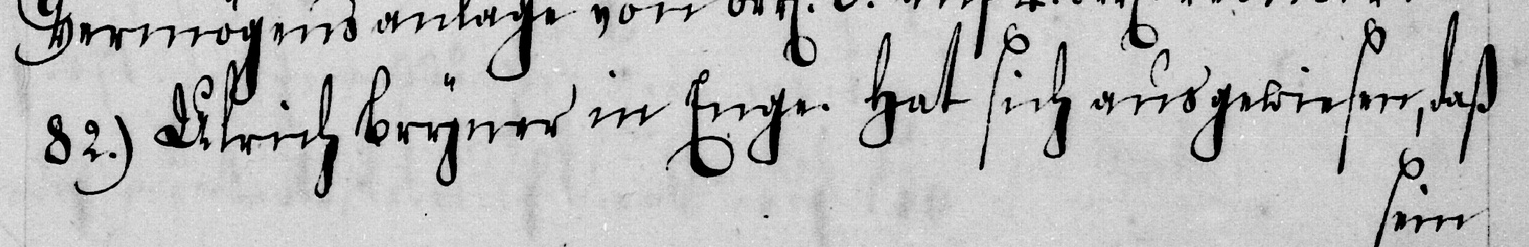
82.) Ulrich Bryner in Enge. Hat sich ausgewiesen, daß
